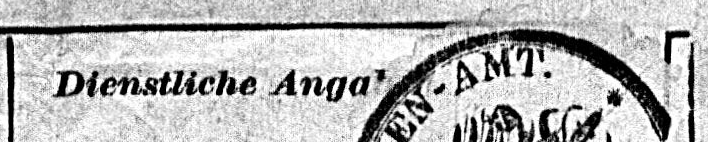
Dienstliche Angab
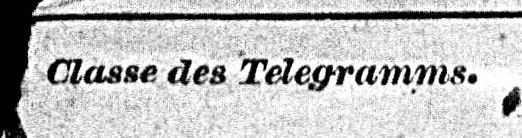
Classe des Telegramms.
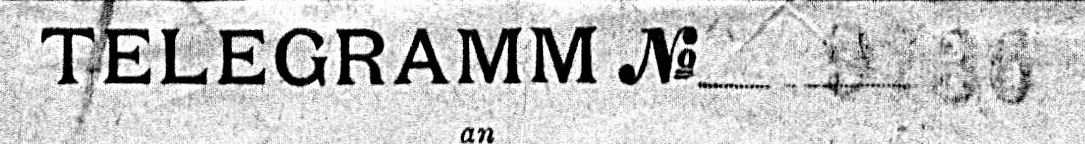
TELEGRAMM N° 9736
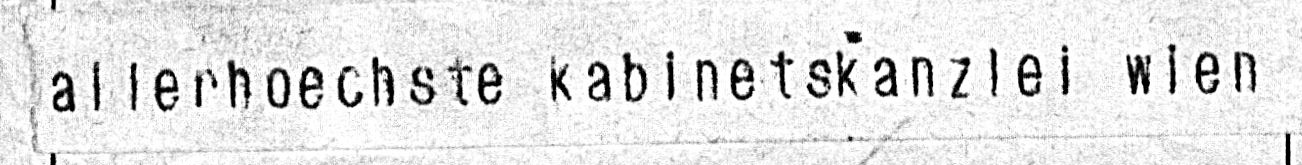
allerhoechste kabinetskanzlei wien
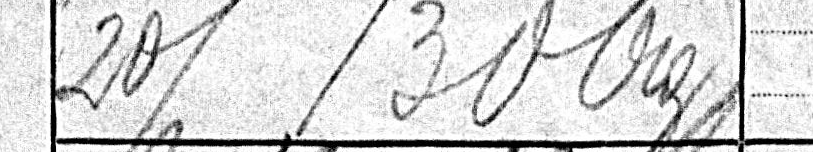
20//300xx
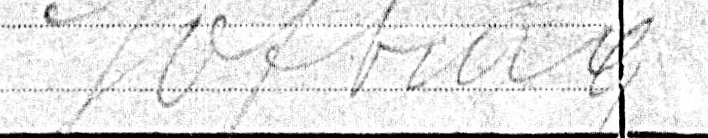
Hofburg
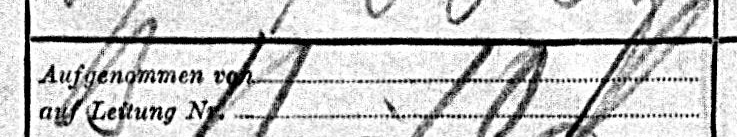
Aufgenommen von......
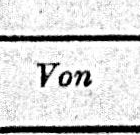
Von
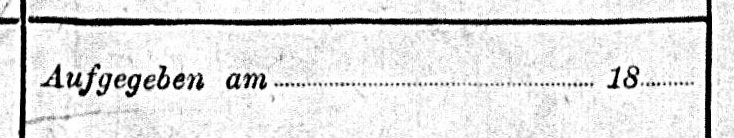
Aufgegeben .....am ....18
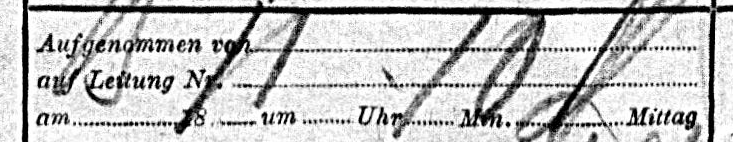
auf Leitung N°.......
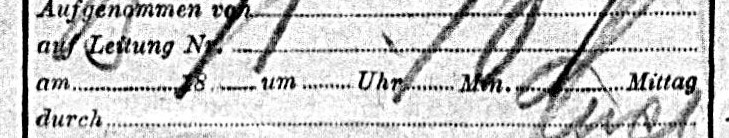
am .... ....18.... um.... Uhr ....Min.... Mittag
